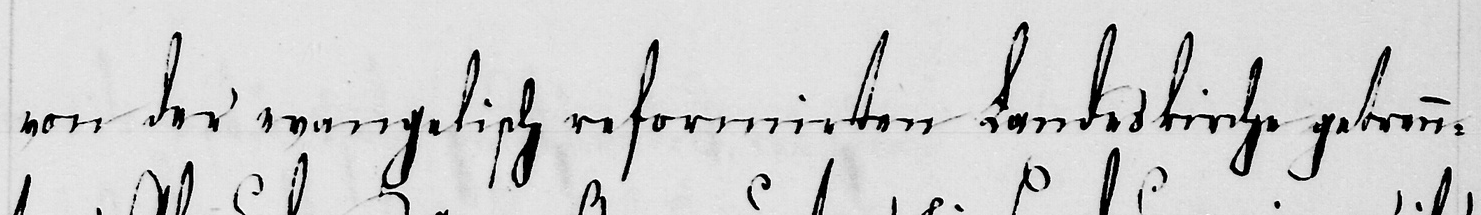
von der evangelisch reformirten Landeskirche getren¬
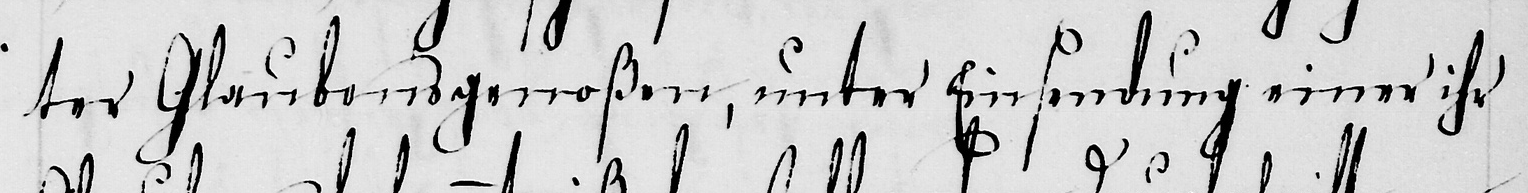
nter Glaubensgenoßen, unter Einsendung einer ihr
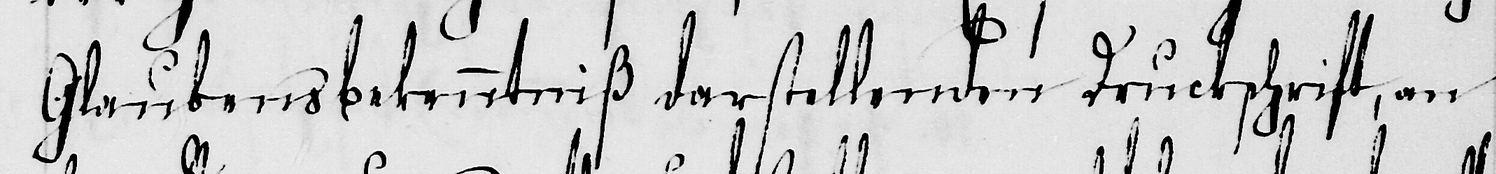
Glaubensbekenntniß darstellenden Druckschrift, an
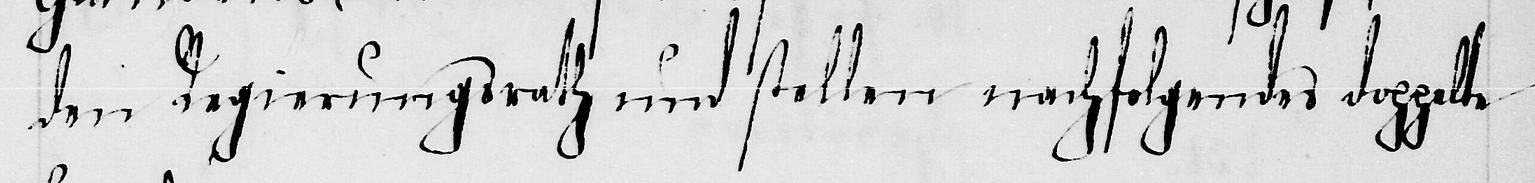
den Regierungsrath und stellen nachfolgendes doppelte
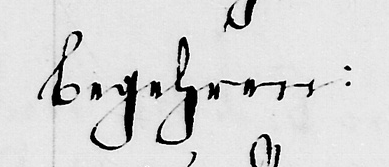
Begehren:
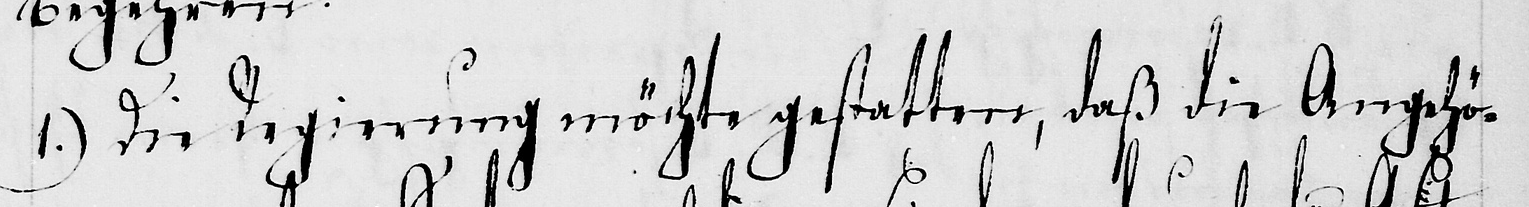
1.) Die Regierung möchte gestatten, daß die Angehö¬
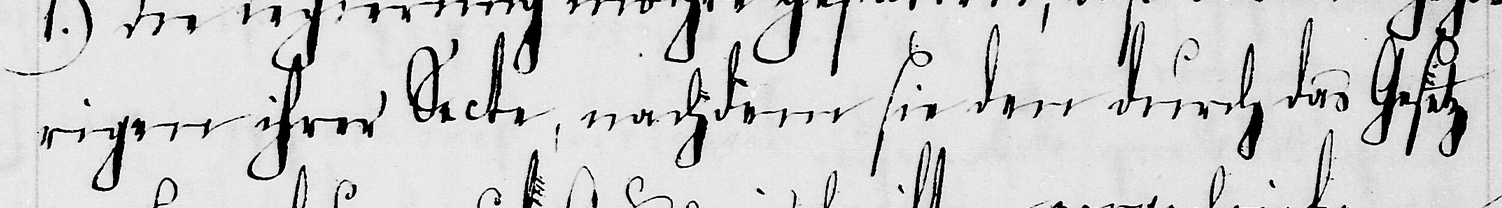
rigen ihrer Secte, nachdem sie den durch das Gesetz
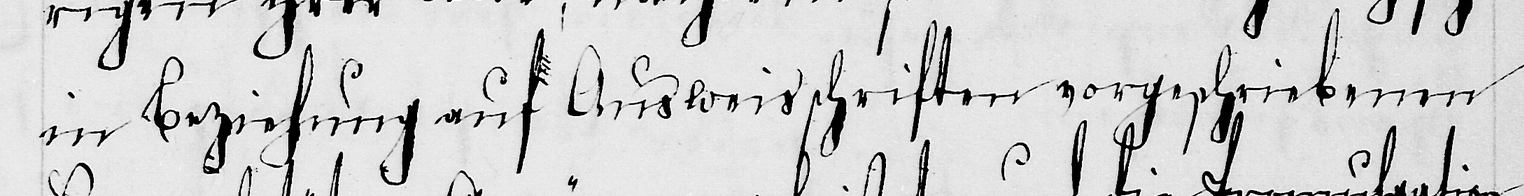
in Beziehung auf Ausweisschriften vorgeschriebenen
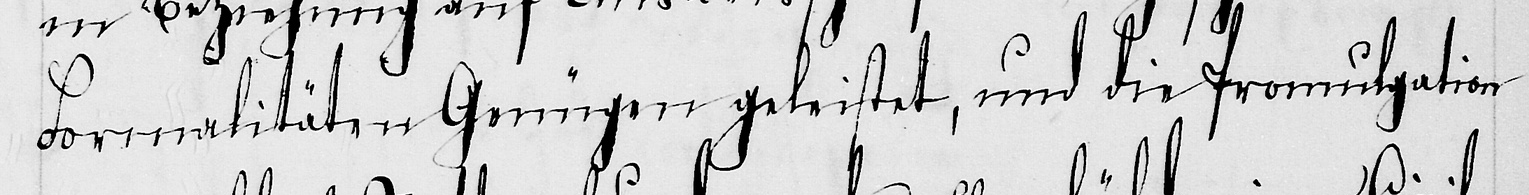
Formalitäten Genügen geleistet, und die Promulgation
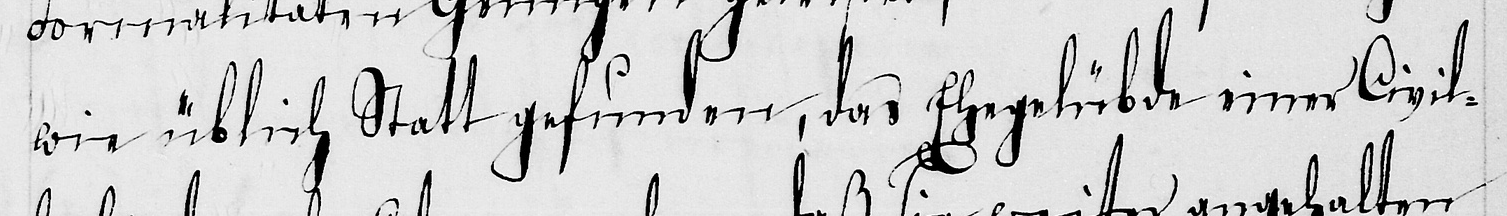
wie üblich Statt gefunden, das Ehegelübde einer Civil¬
